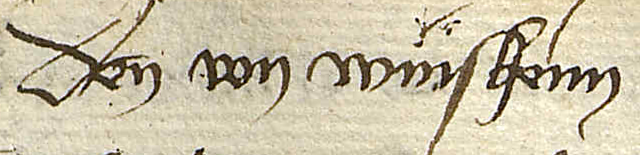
Den von winſheim
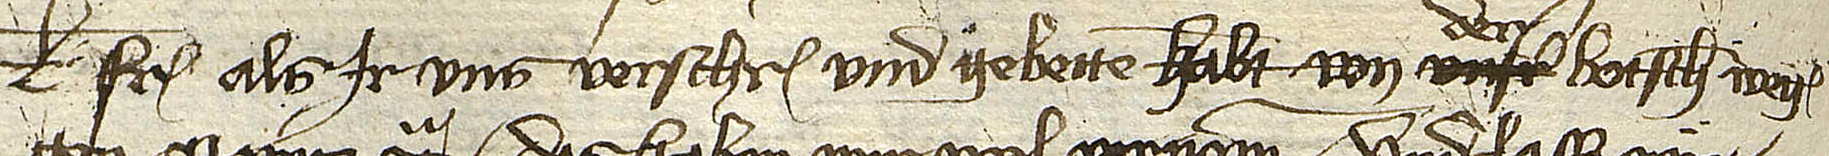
L* fr* als Ir vns verſchr* vnd gebette* habt von vnſ*r botſch* weg*
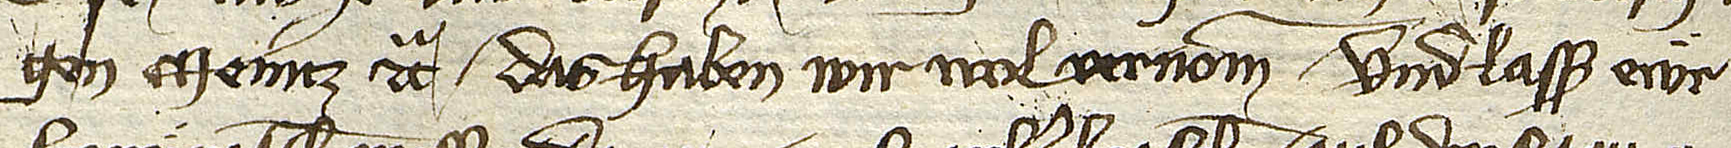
gen Meincʒ ec* / das haben wir wol vernom* / Vnd laſſ* ewr
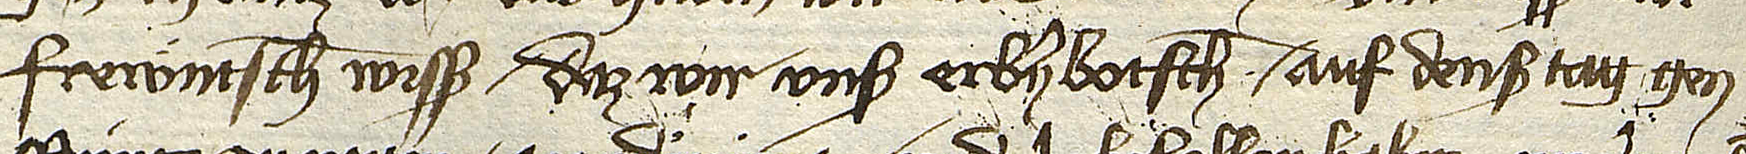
frewntſch* wiſſ* / daʒ wir vnſ* erbn* botſch* / auf denſ* tag gen
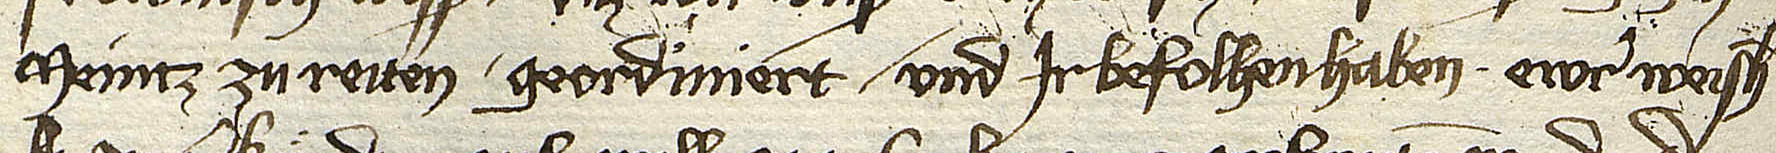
Meincʒ ʒu reiten / geordiniert / vnd Ir befolhen haben . ewr* weiſh*
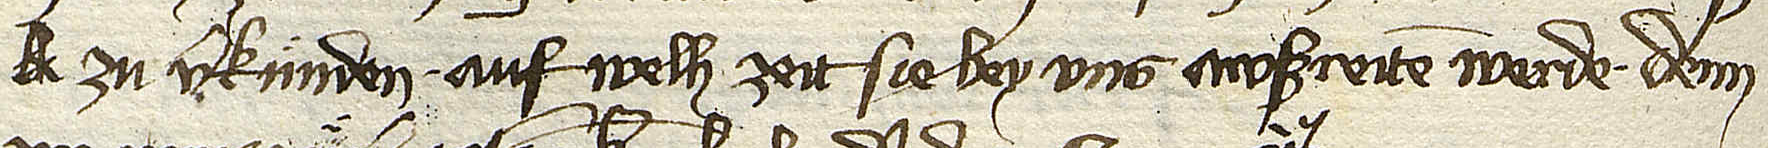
b ʒu v*künden . auf welh ʒeit ſie bey vns awſʒreite* werde . denn
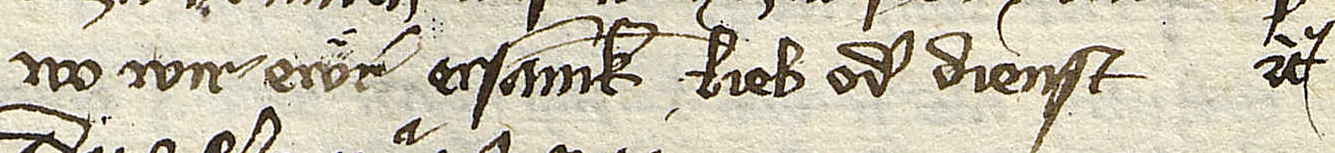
wo wir ewr* erſamk* lieb od* dienſt ec*
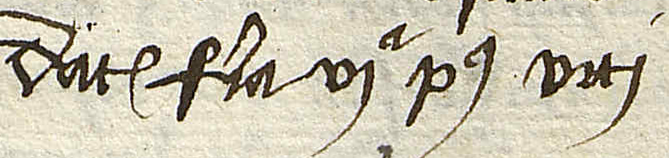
Dat* fia* vi* p* Viti
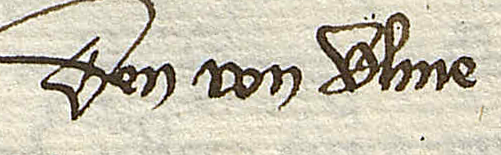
Den von Vlme
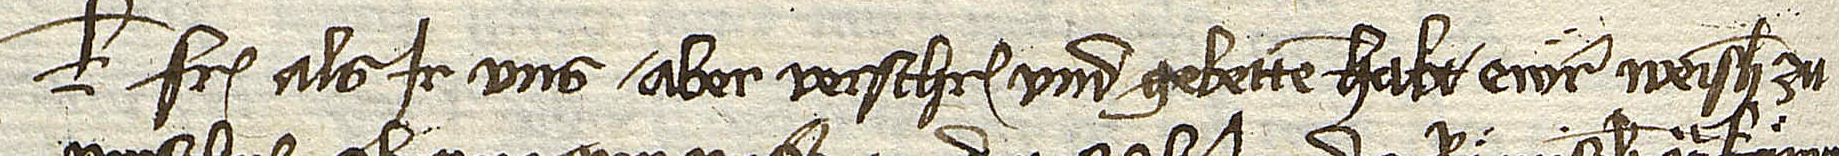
L* fr* als Ir vns / aber verſchr* vnd gebette* habt ewr* weiſh* ʒu
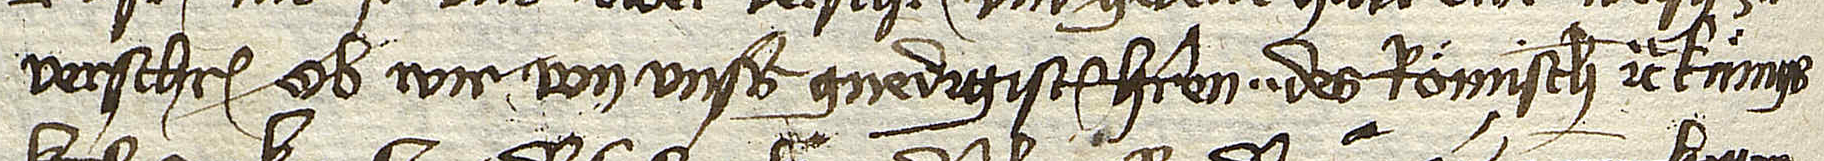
verſchr* ob wir von vnſ*s gnedigiſt* h*ren ~ des Römiſch* ec* künigs
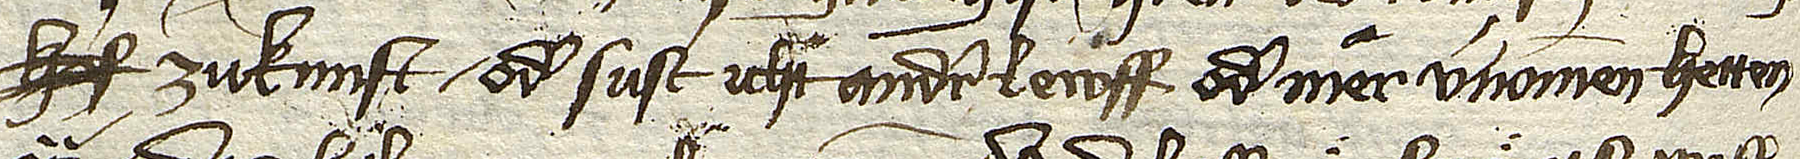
hof ʒukunft / od* ſuſt icht and*r lewff od* mër v*nom*en hetten
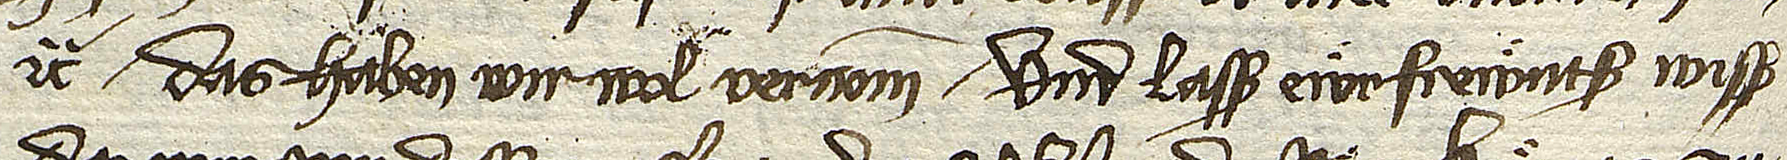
ec* / Das haben wir wol vernom* / Vnd laſſ* ewr frewntſ* wiſſ*
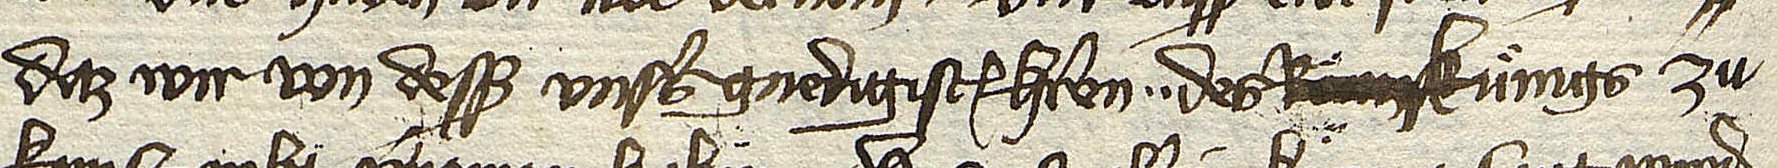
daʒ wir von deſſ* vnſ*s gnedigiſt* hr*en ~ des Römiſ künigs ʒu
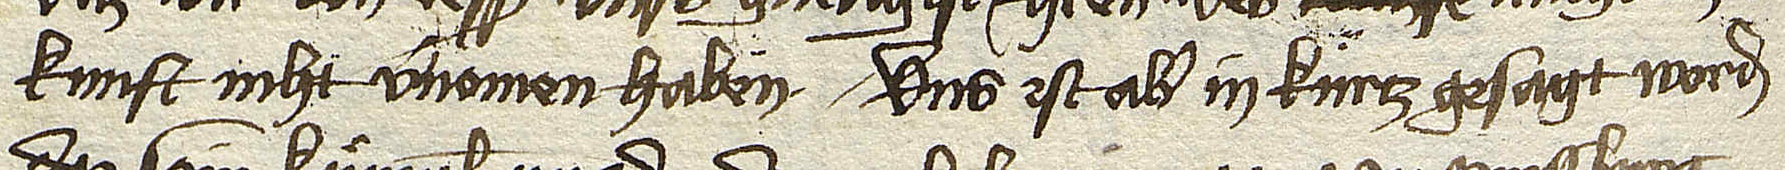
kunft niht v*nomen haben / Vns iſt ab* in kürcʒ geſagt word*
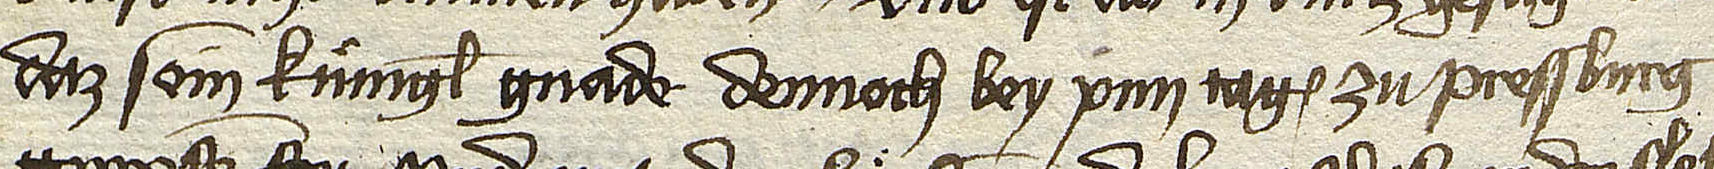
daʒ ſein künigl* gnade dennoch bey xiiii tag* ʒu preſſburg
